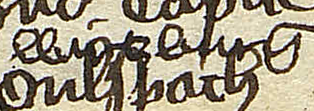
wirtʒburg*
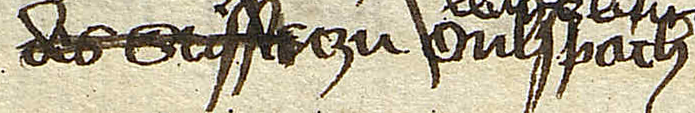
des Stiffts cʒu Onlſpach
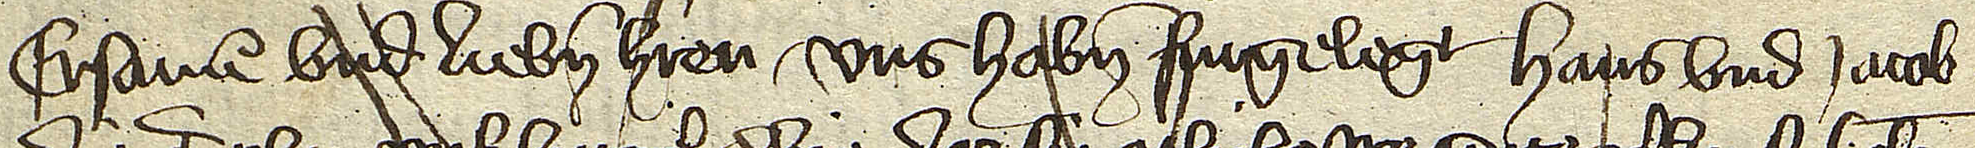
Erſame* vnd liebn* h*ren / vns habn* fürgelegt hans vnd Iacob
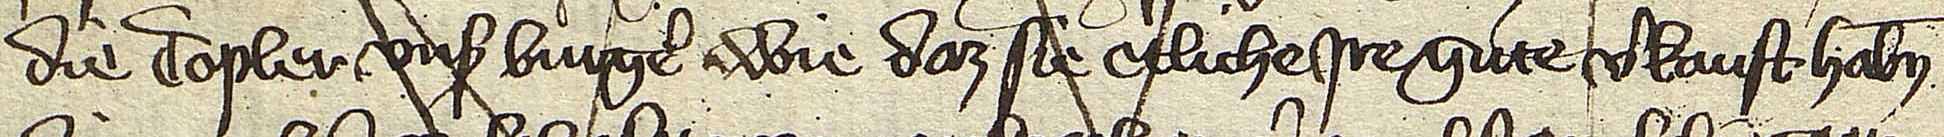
die Topler vnſ* burge* / wie daʒ ſie etliche Ire gute v*kauft habn*
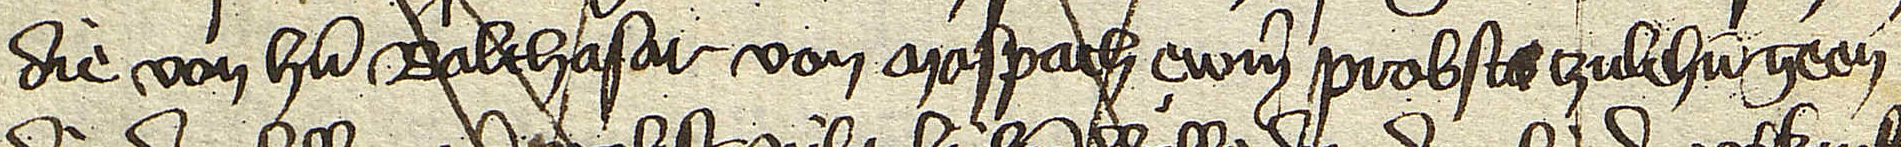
die von hn* Balthaſar von Maſpach ewm* probſts cʒulehn* geen
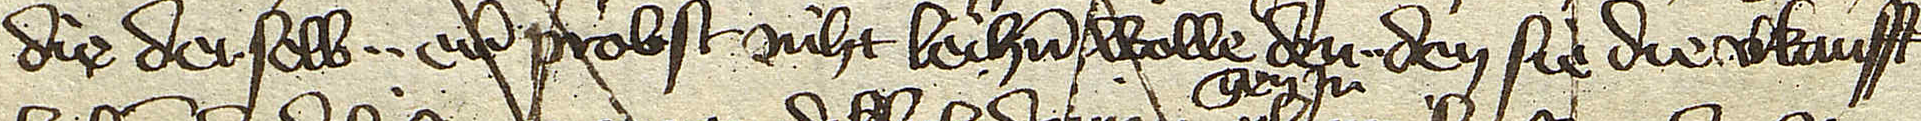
die derſelb ~ ew* probſt niht leihn* wölle den ~ den ſie die v*kaufft
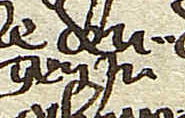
gen In
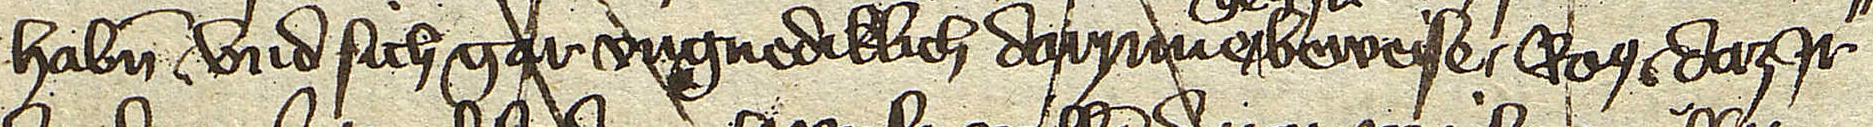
habn* / vnd ſich gar vngnediklich darynne beweiſe / Ro* / daʒ Ir
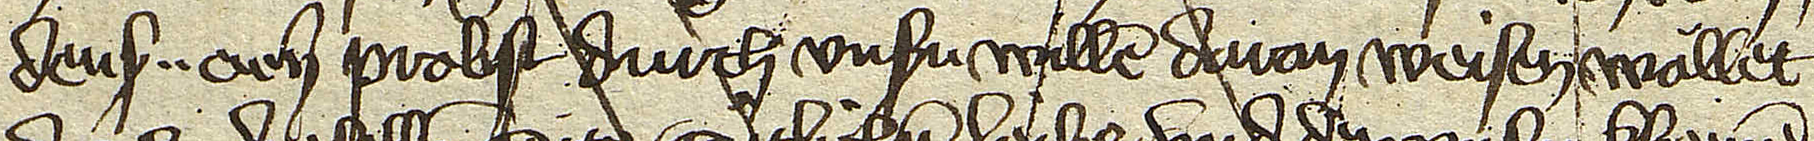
denſ* ~ ewn* probſt durch vnſ*n wille* daran weiſen wöllet
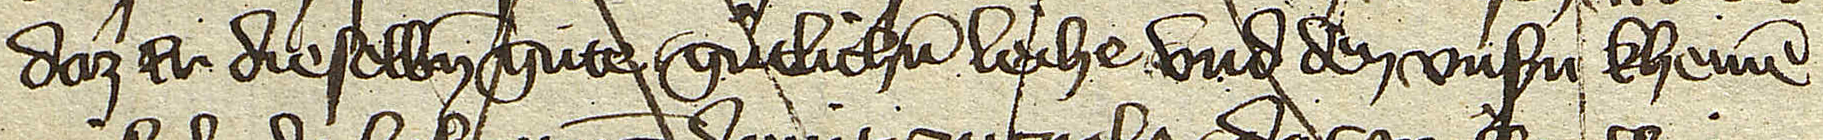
daʒ Er dieſelbn* gute / gütlichn* leihe vnd den vnſ*n kheine*
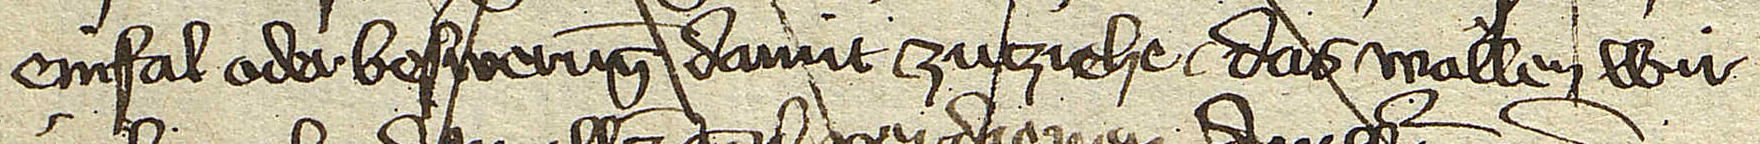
einfal oder beſwerug* damit cʒucʒiehe / das wöllen wir
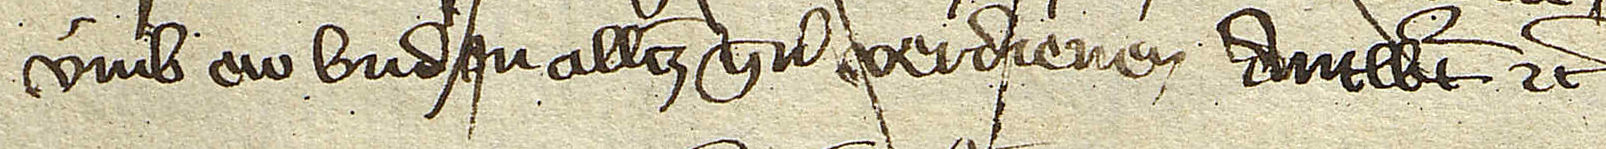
v̈mb ew vnd In allcʒ* gn* verdienen Antwt* ec*
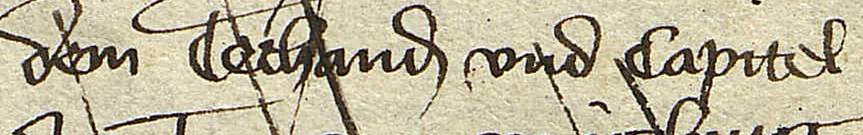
Dem Techand* vnd Capitel
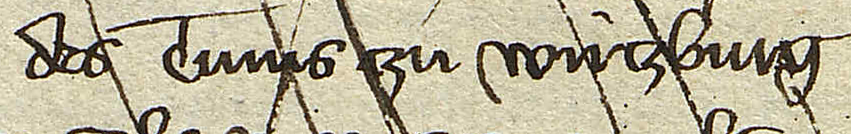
des Tums cʒu wircʒburg
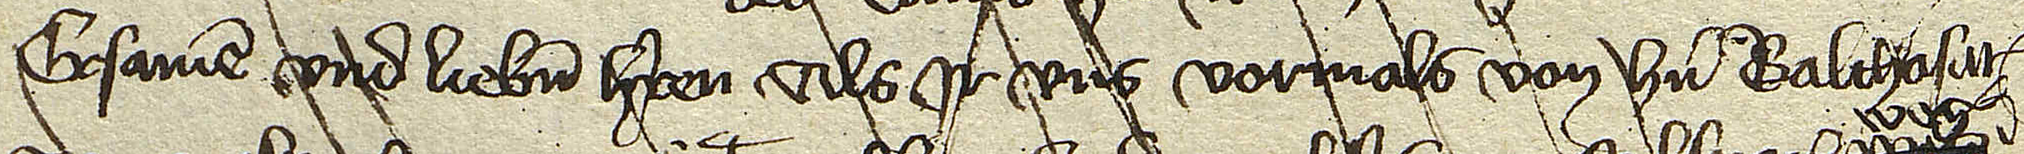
Erſame* vnd liebn* h*ren / Als Ir vns vormals von hn* Balthaſar
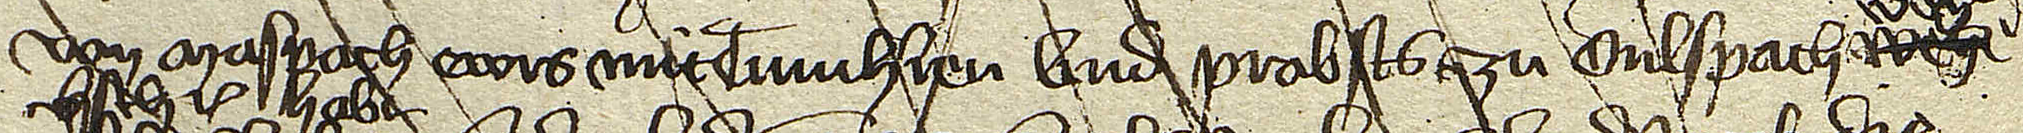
von Maſpach ewrs mit Tumh*ren vnd probſts cʒu Onlſpach wege*
